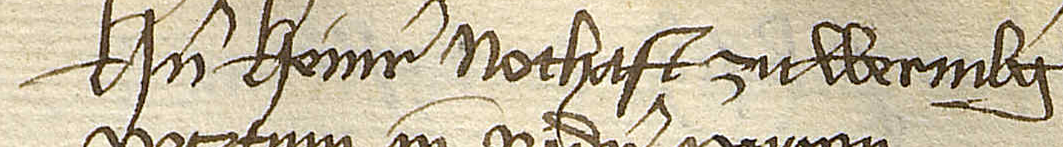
Hn* Heinr* Nothaft ʒu Wermb*g
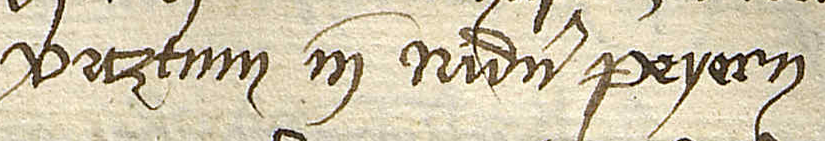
vicʒtum in Nidn* Peyern
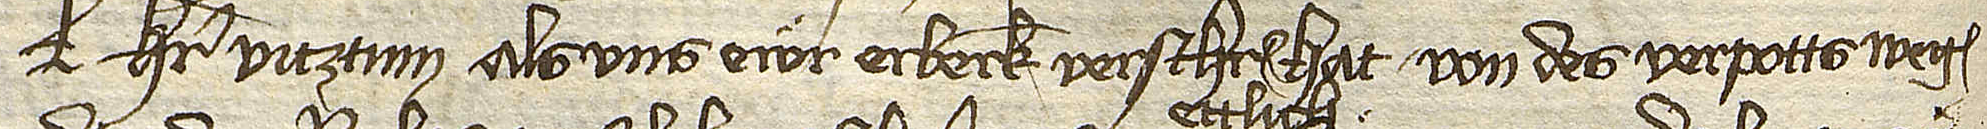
L* Hr* vicʒtum als vns eẅr erberk* verſchr* hat / von des verpotts weg*
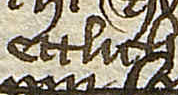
ettlich
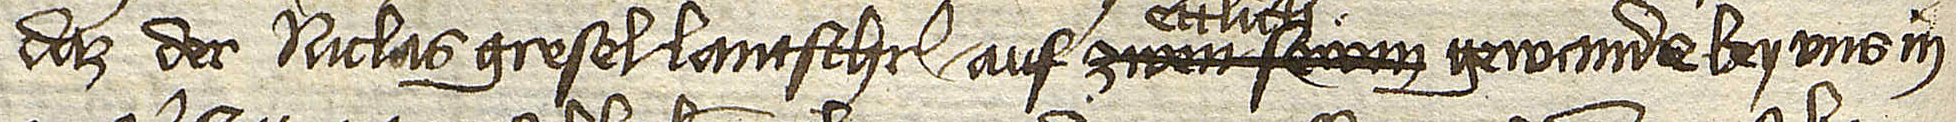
daʒ der Niclas greſel lantſchr* / auf ʒwen ſeẅm gewande bey vns in
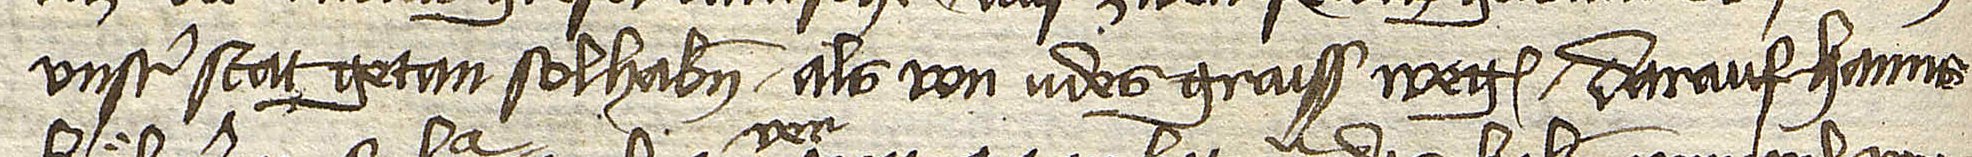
vnſr* ſtat getan ſol habn* / als von ~ des graiſſ weg* / Darauf hanns
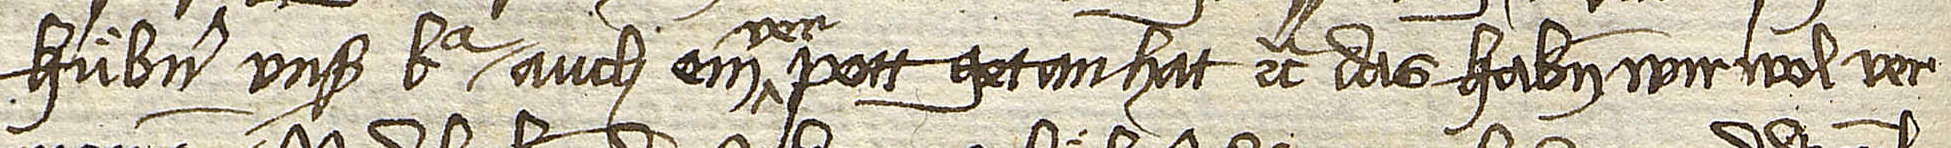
hübn* vnſ* b* / auch ein pott getan hat ec* das habn* wir wol ver =
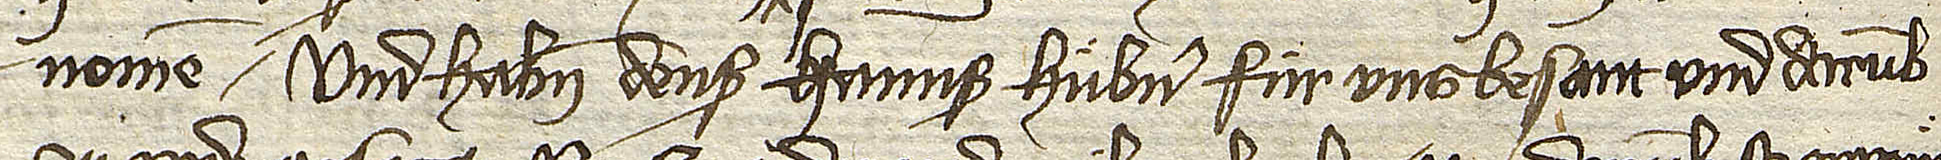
nome* / Vnd habn* denſ* hannſ* hübn* für vns beſant vnd darub*
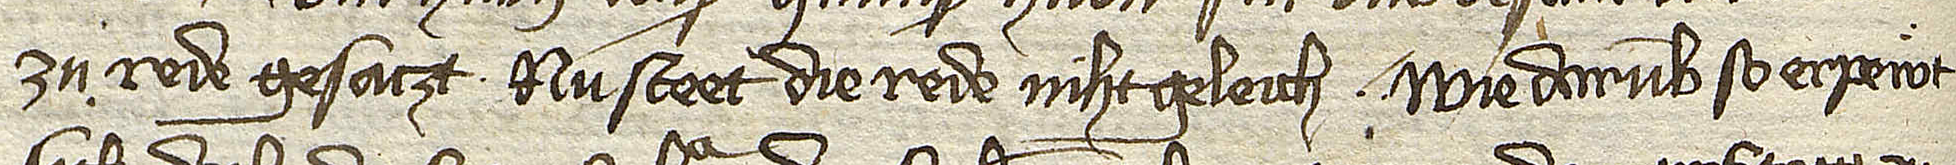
ʒu rede geſacʒt . Nu ſteet die rede niht geleich / wie darub* ſo erpeẅt
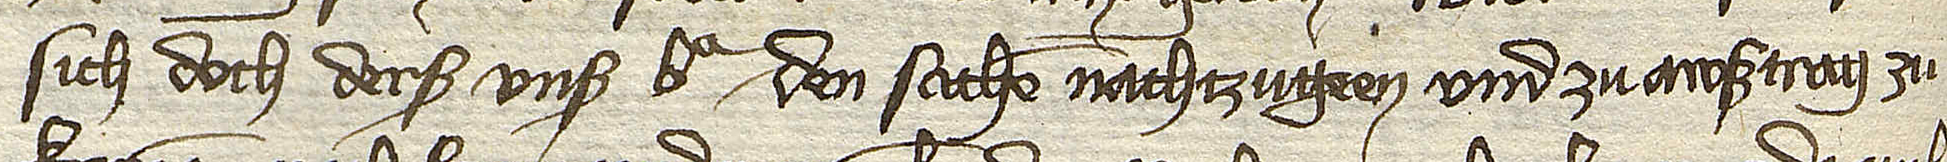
ſich doch derſ* vnſ* b* / Den ſache* nachcʒugeen vnd ʒu awſʒtrag ʒu
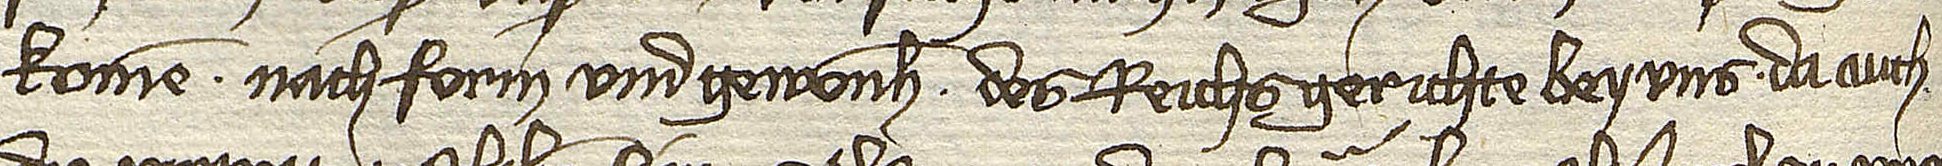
kome* . nach form vnd gewonh* . des Reichs gerichte bey vns . da auch
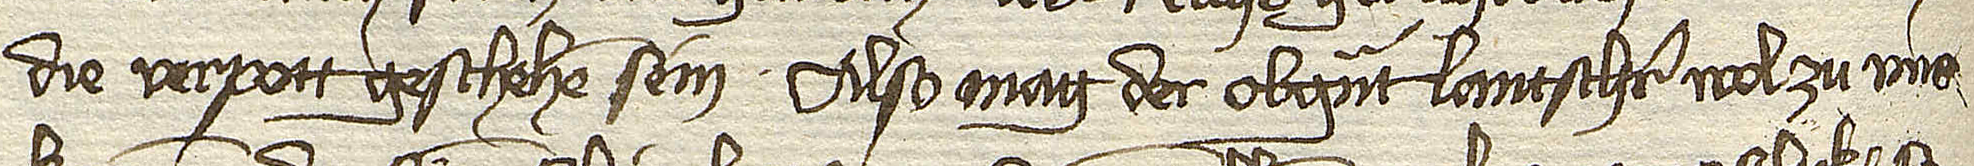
die verpott geſchehe* ſein . Alſo mag der obgnt* lantſchr* wol ʒu vns
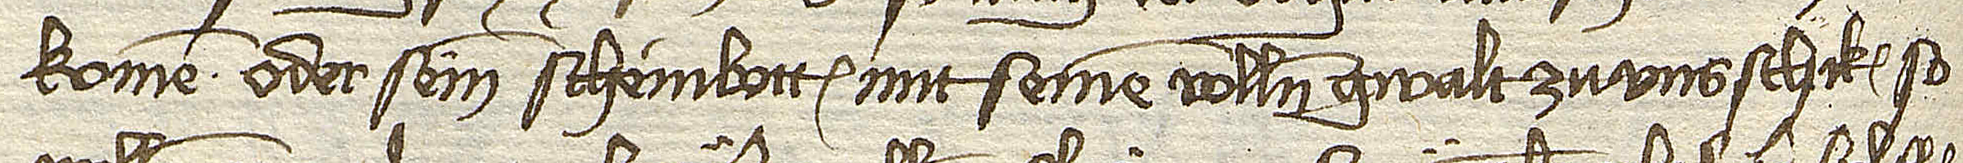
kome* . oder ſein* ſcheinbott* mit ſeine* volln* gwalt ʒu vns ſchik* ſo
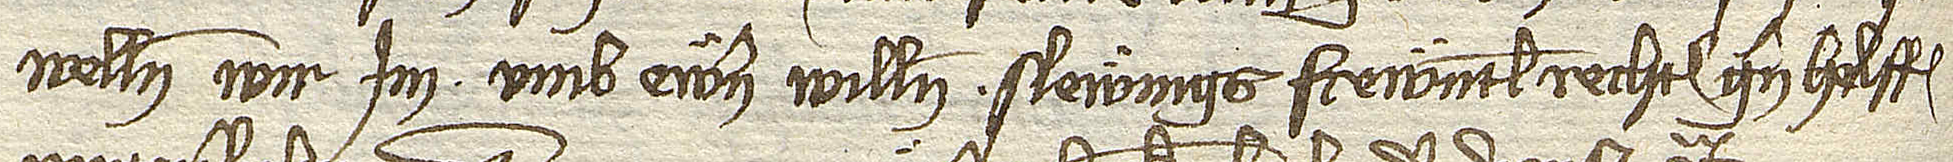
welln* wir Im vmb eẅ*n willn* . ſleẅnigs freẅntl* recht* g*n helff*
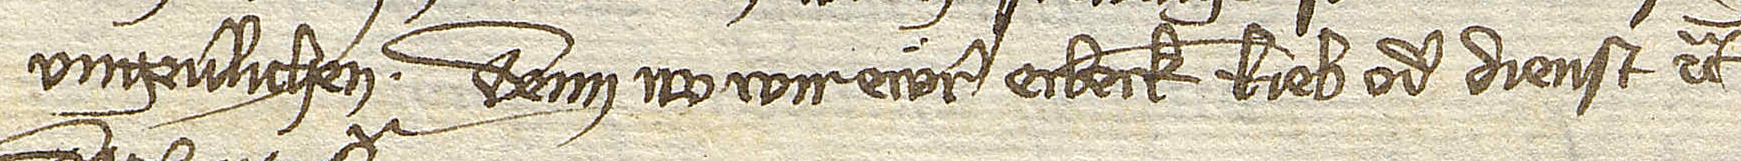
vngeu*lichen . Denn wo wir eẅr* erberk* lieb od* dienſt ec*
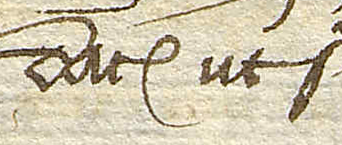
Dat* ut ſ*
